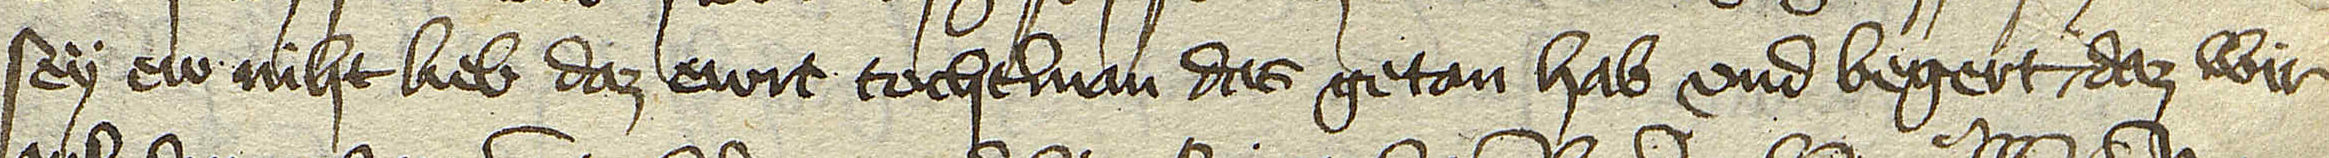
ſey ew niht lieb daʒ ewr tocht*man das getan hab vnd begert / daʒ wir
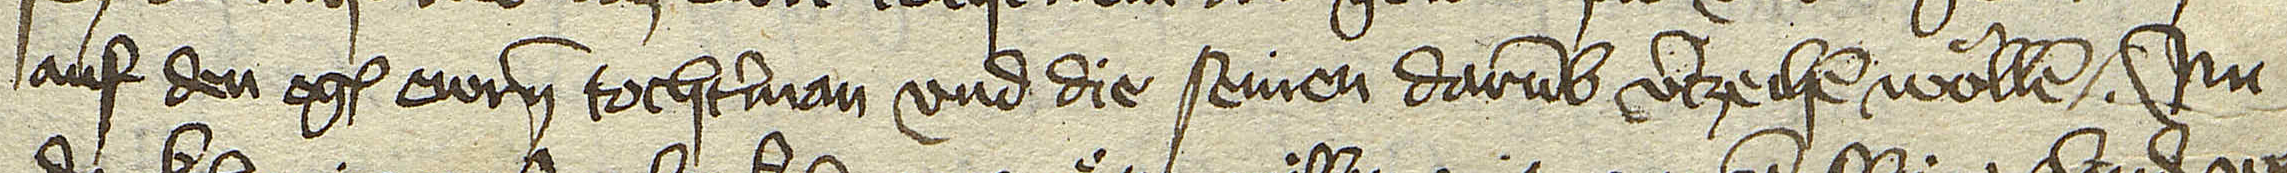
auf den eg* ewr*n tocht*man vnd die ſeinen darub* v*cʒeihe* wölle* / . Nu
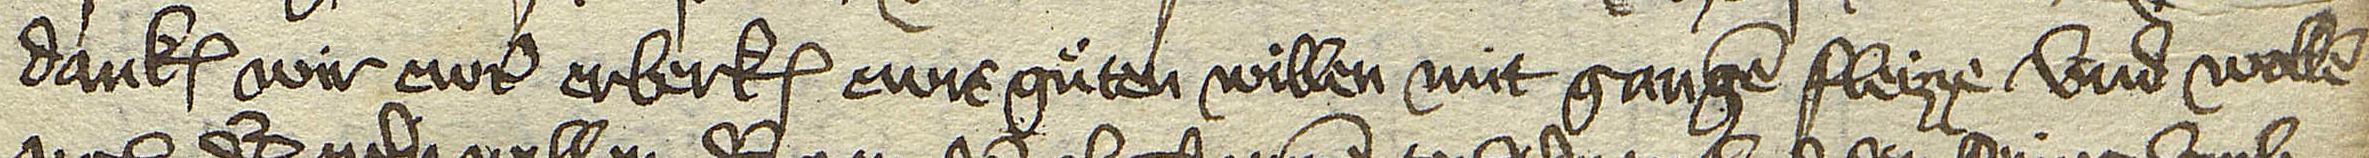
dank* wir ewr* erberk* ewrs güten willen mit gancʒe* fleiʒʒe / vnd wolle*
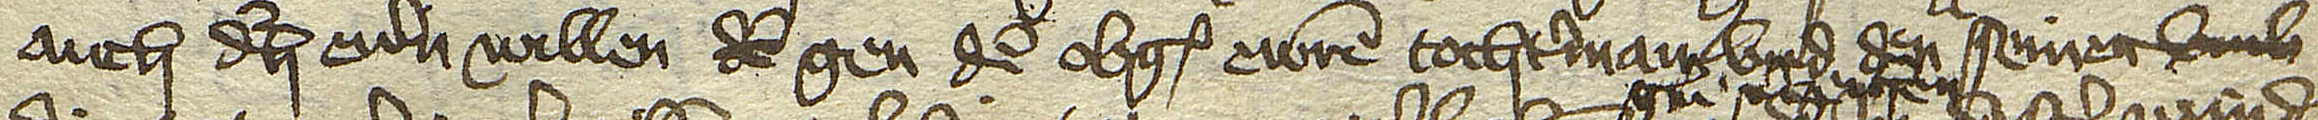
auch d*h ew*n willen d* gen d* obg* ewre* tocht*man vnd den ſeinen vmb
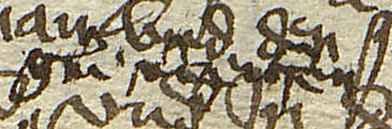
g*n v*cʒeihen
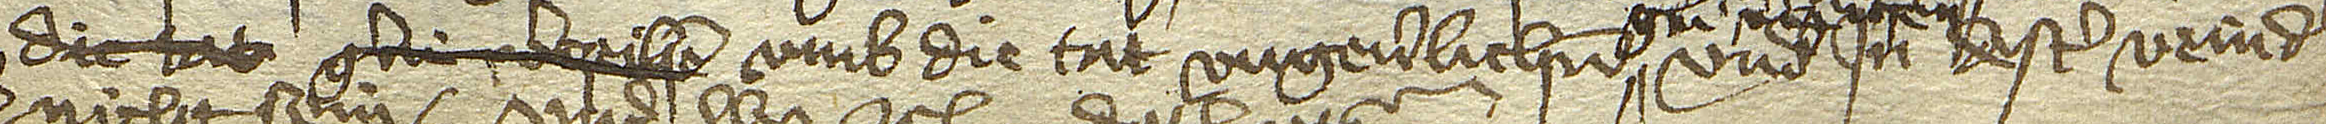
die tat g*ne v*cʒeihe* vmb die tat vngeu*lichn* vnd In deſt* veind*
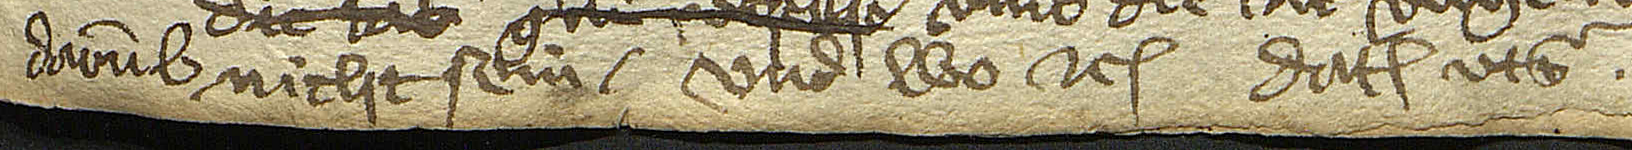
darub* nicht ſein / vnd wo ec* dat* vts*.
